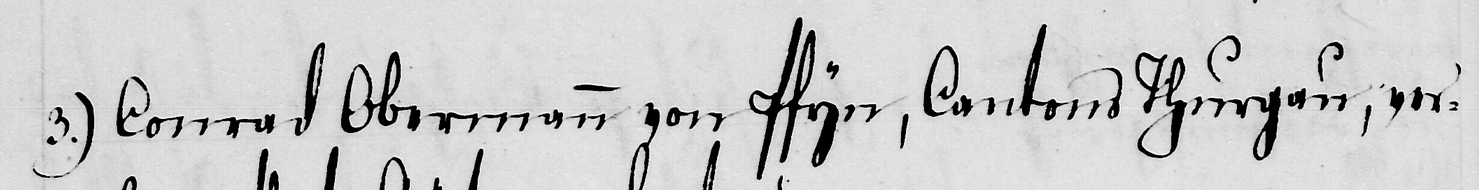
3.) Conrad Obermann von Pfyn, Cantons Thurgau, ver¬
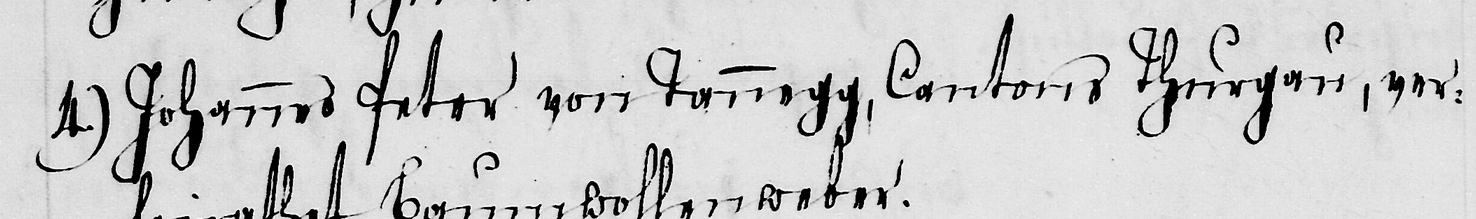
4.) Johannes Peter von Tannegg, Cantons Thurgau, ver¬
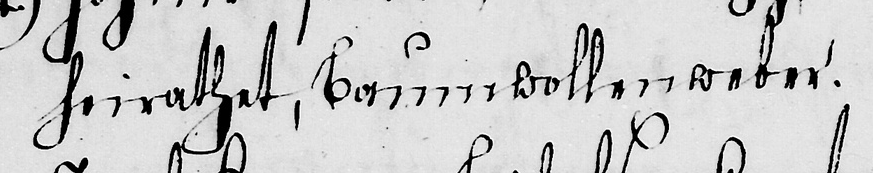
heirathet, Baumwollenweber.
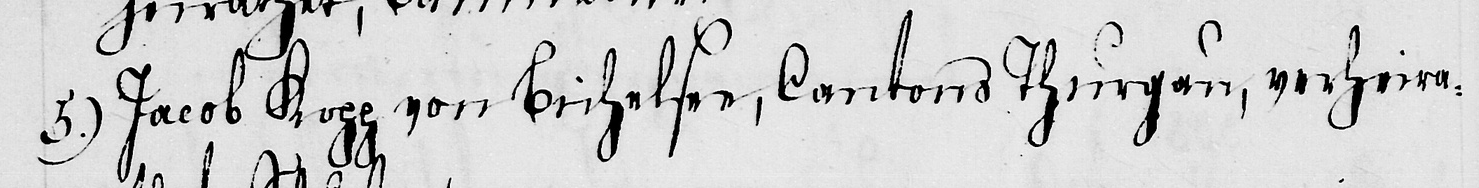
5.) Jacob Kopp von Bichelsee, Cantons Thurgau, verheira¬
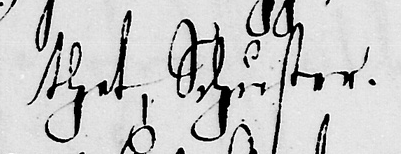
thet, Schuster.
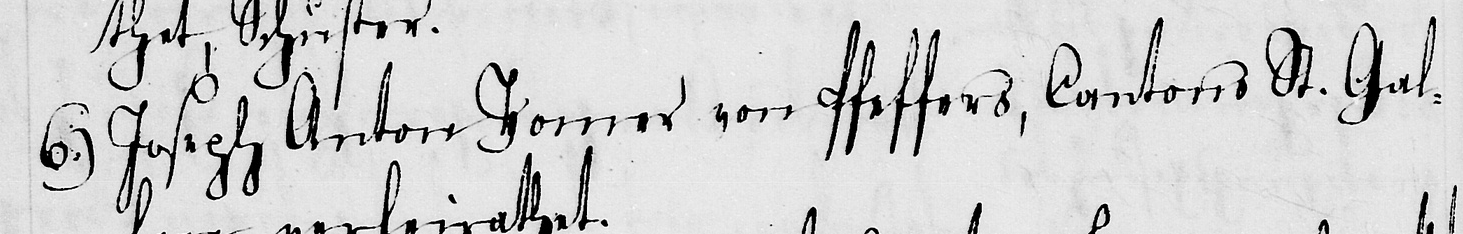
6.) Joseph Anton Vomer von Pfeffers, Cantons St. Gal¬
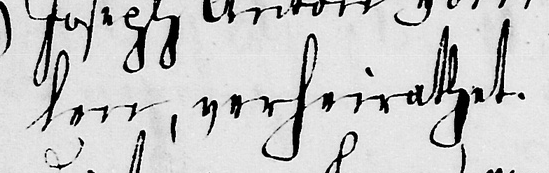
len, verheirathet.
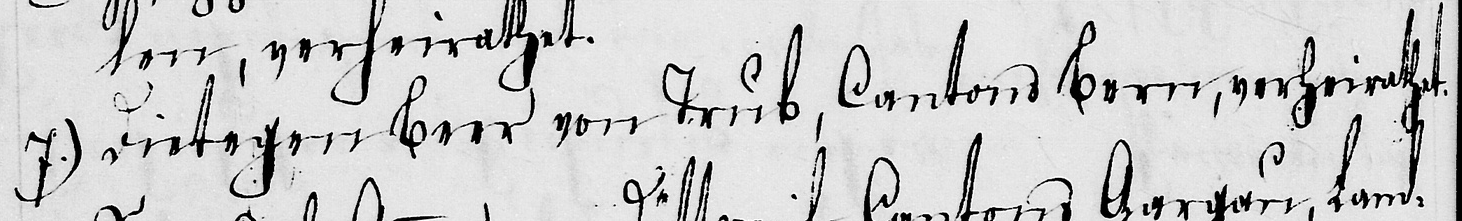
7.) Dietegen Beer von Trub, Cantons Bern, verheirathe¬
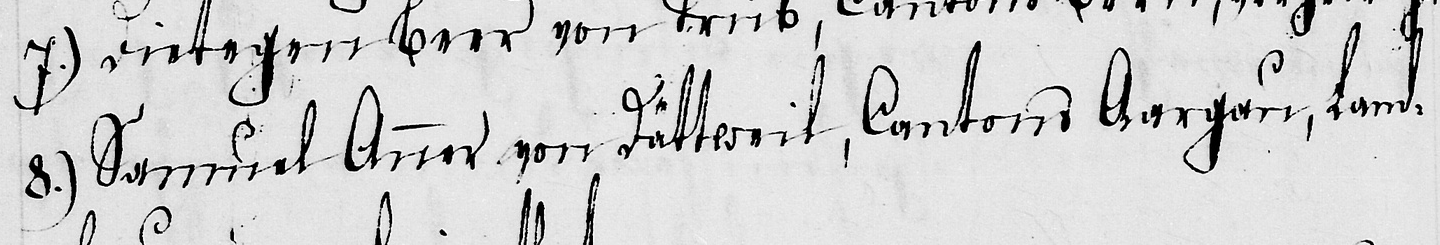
8.) Samuel Anner von Dättweil, Cantons Aargau, Land¬
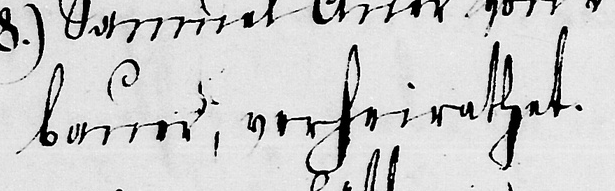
bauer, verheirathet.
